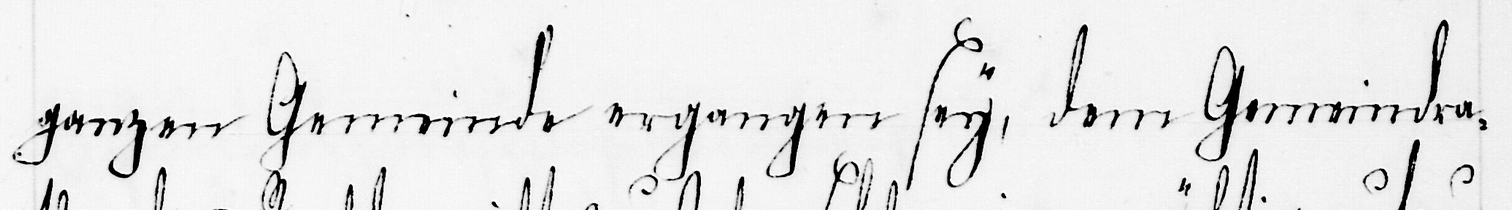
ganzen Gemeinde ergangen sey, dem Gemeindra¬
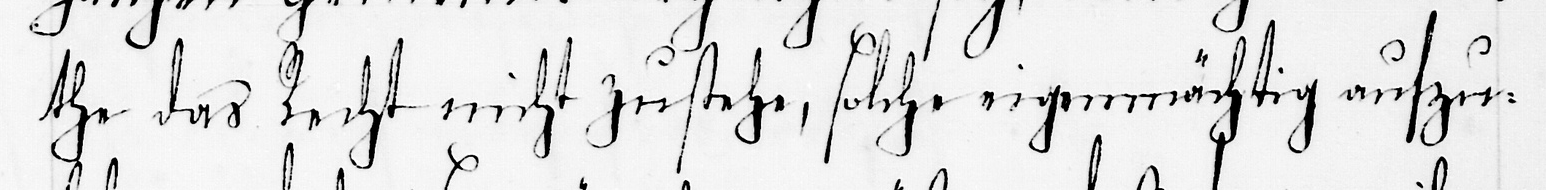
the das Recht nicht zustehe, solche eigenmächtig aufzu¬
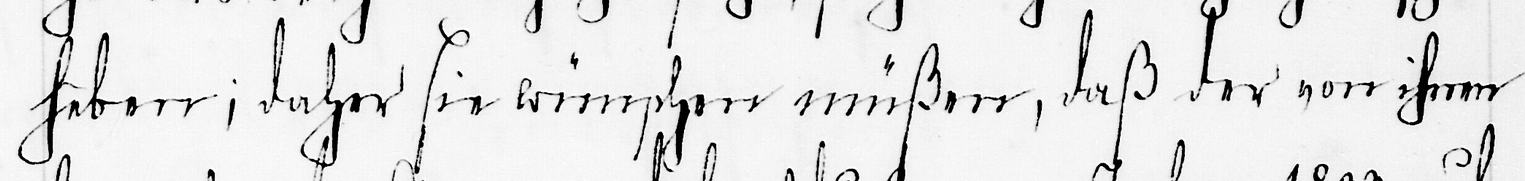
heben; daher sie wünschen müßen, daß der von ihnen
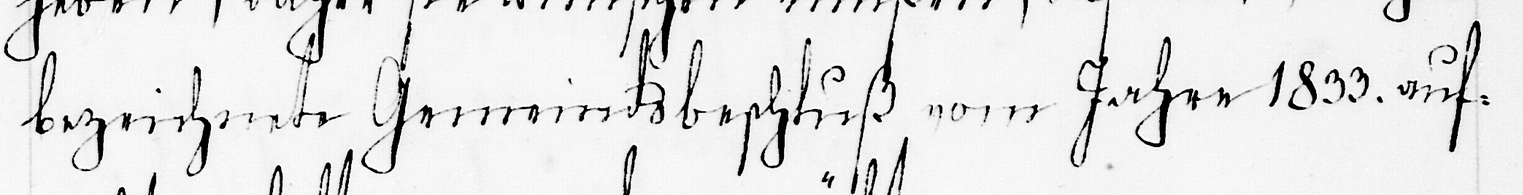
bezeichnete Gemeindsbeschluß vom Jahre 1833. auf¬
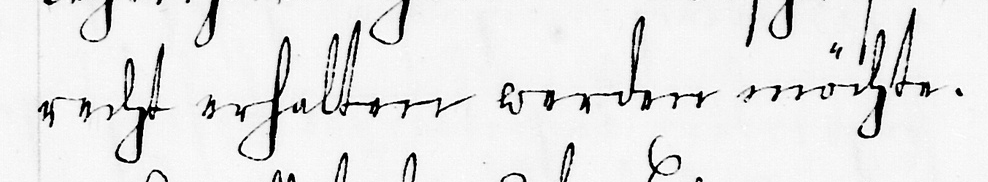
recht erhalten werden möchte.
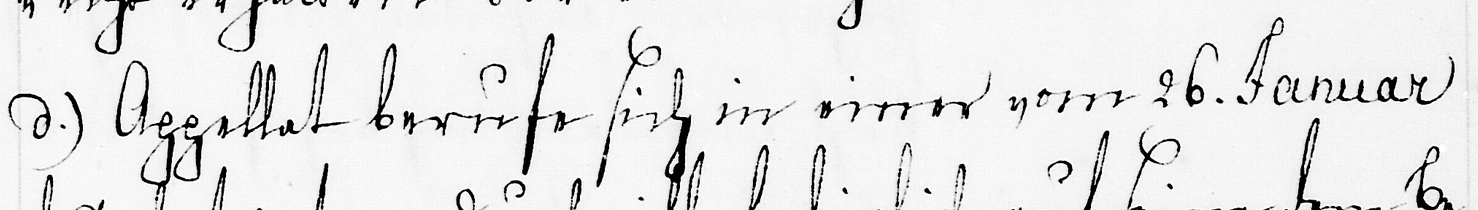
d.) Appellat berufe sich in einer vom 26. Januar
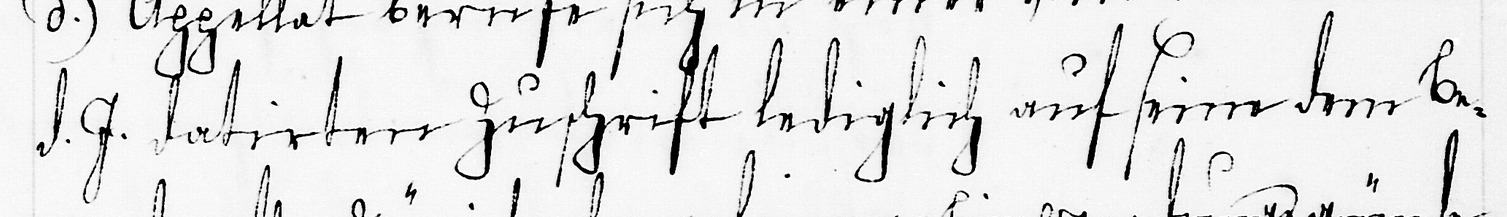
d. J. datirten Zuschrift lediglich auf seine dem Be¬
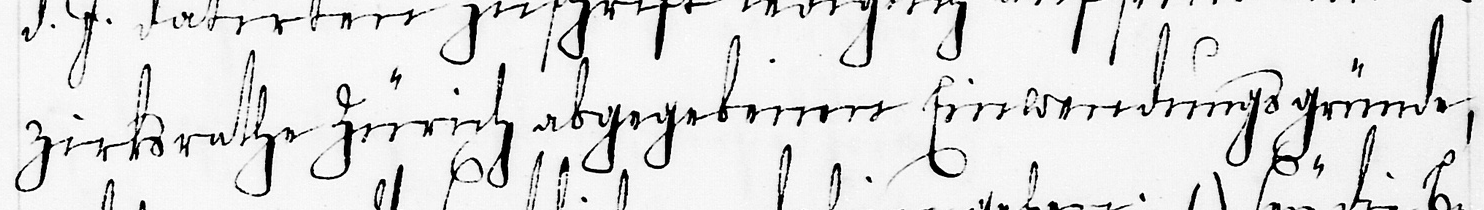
zirksrathe Zürich abgegebenen Einwendungsgründe,
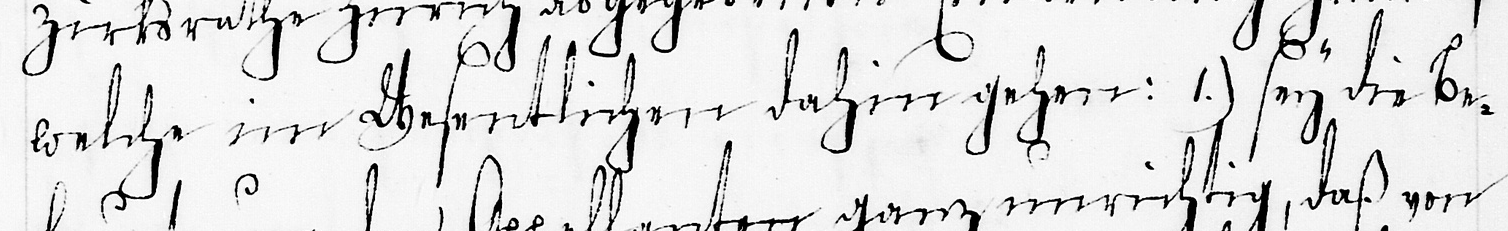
welche im Wesentlichen dahin gehen: 1.) Sey die Be¬
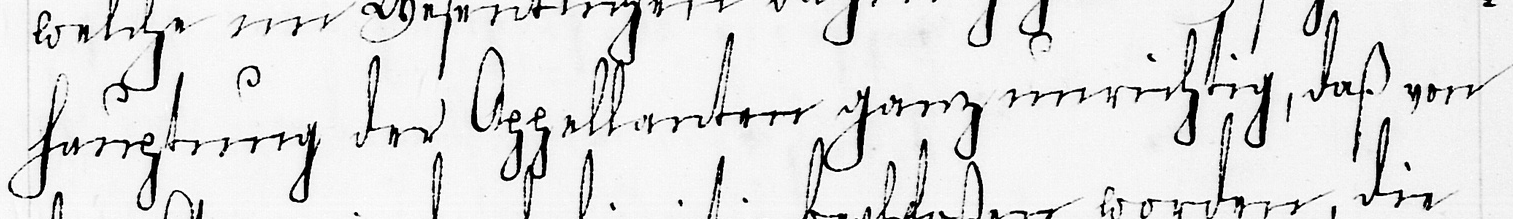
hauptung der Appellanten ganz unrichtig, daß von
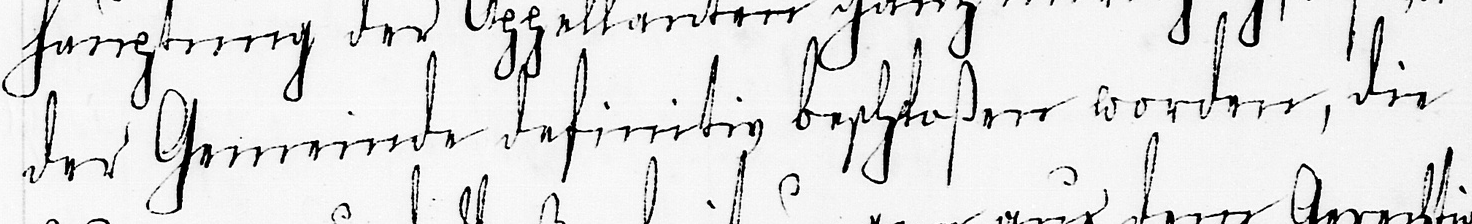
der Gemeinde definitiv beschloßen worden, die
